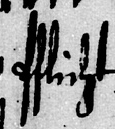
Lit¬
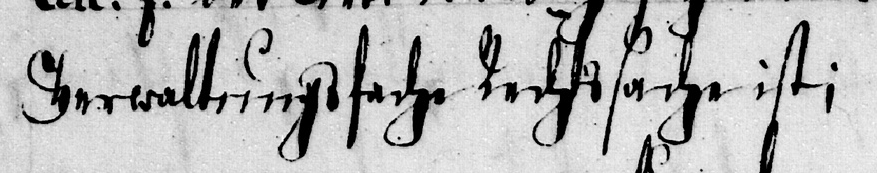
Verwaltungsfache Rechtssache ist;
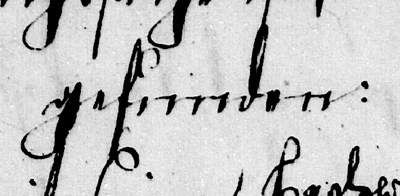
gefunden:
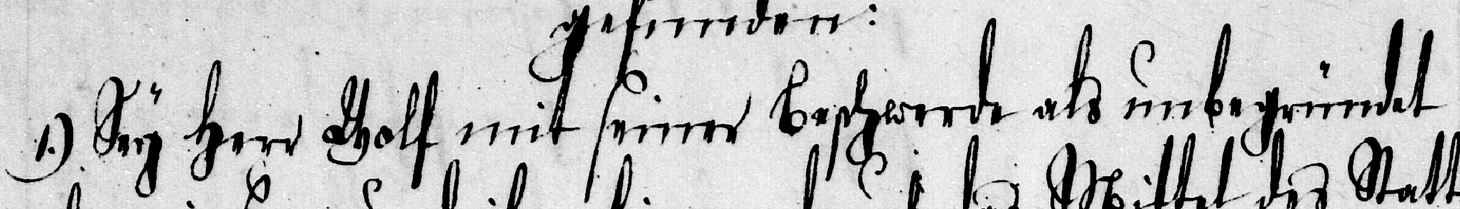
1.) Sey Herr Wofl mit seiner Beschwerde als unbegründet
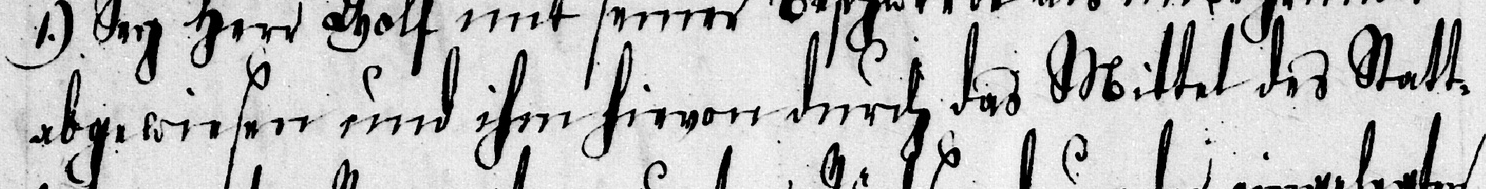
abgewiesen und ihm hievon durch das Mittel des Statt¬
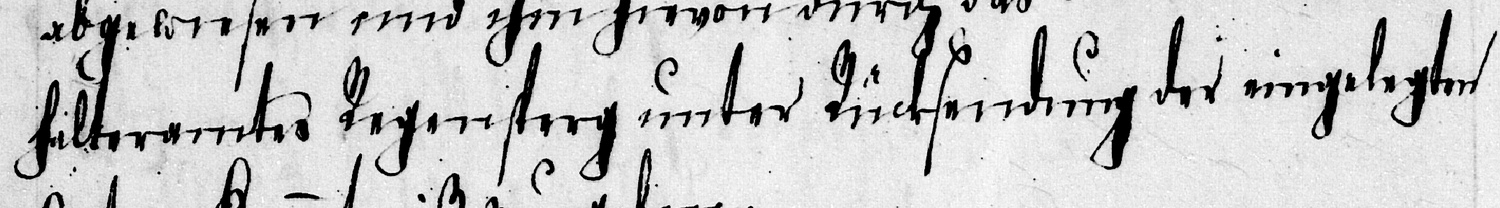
halteramtes Regensperg unter Rücksendung der eingelegten
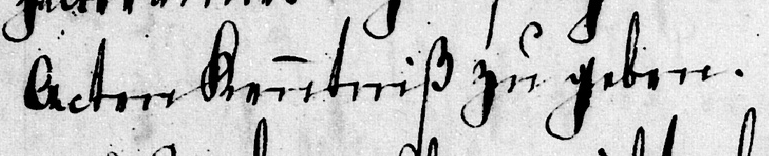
Acten Kenntniß zu geben.
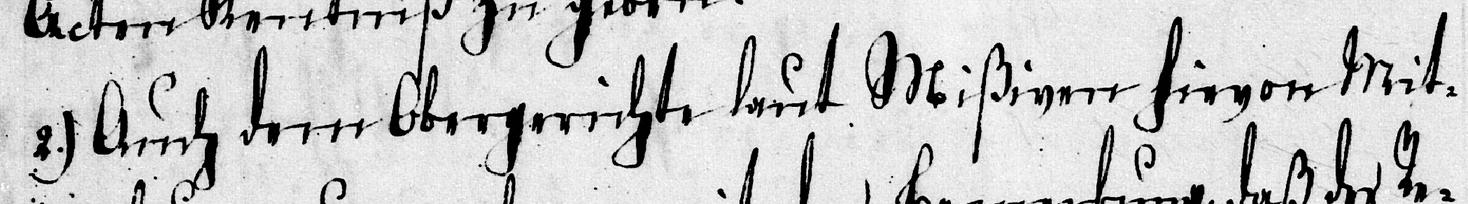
2.) Auch dem Obergerichte laut Mißiven hievon Mit¬
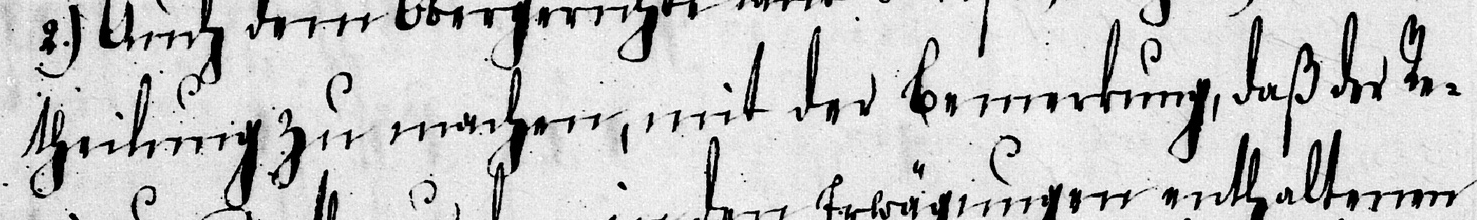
theilung zu machen, mit der Bemerkung, daß der Re¬
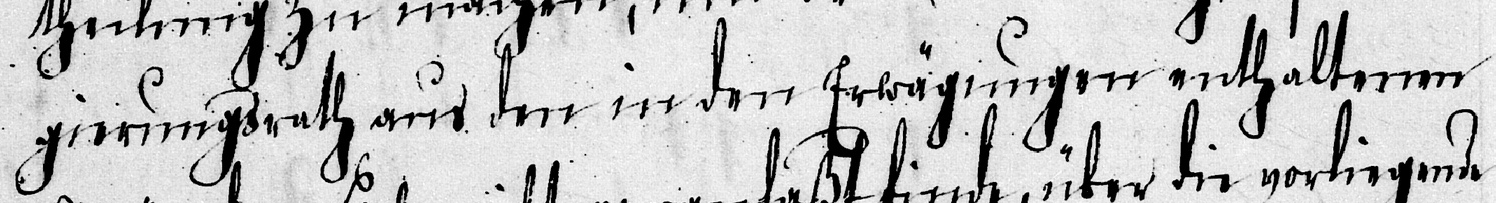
gierungsrath aus den in den Erwägungen enthaltenen
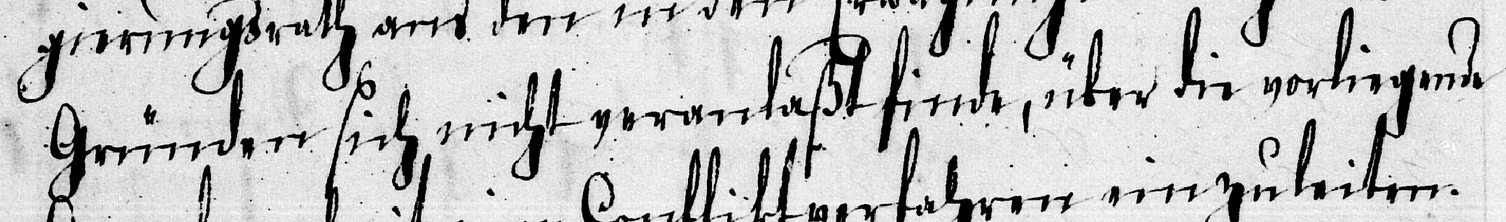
Gründen sich nicht veranlaßt finde, über die vorliegende
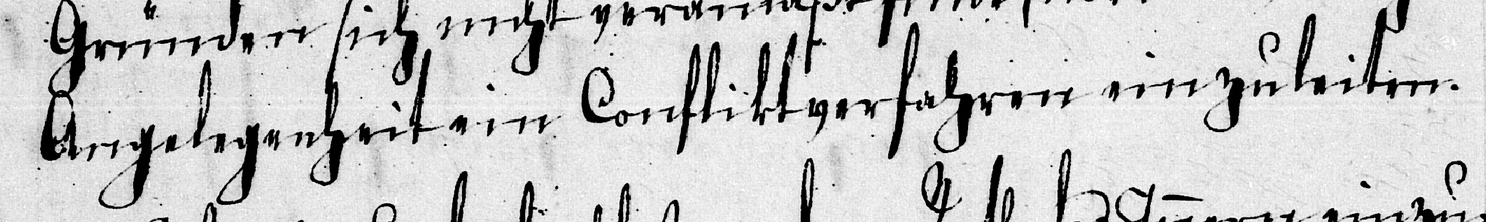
Angelegenheit ein Confliktverfahren einzuleiten.
